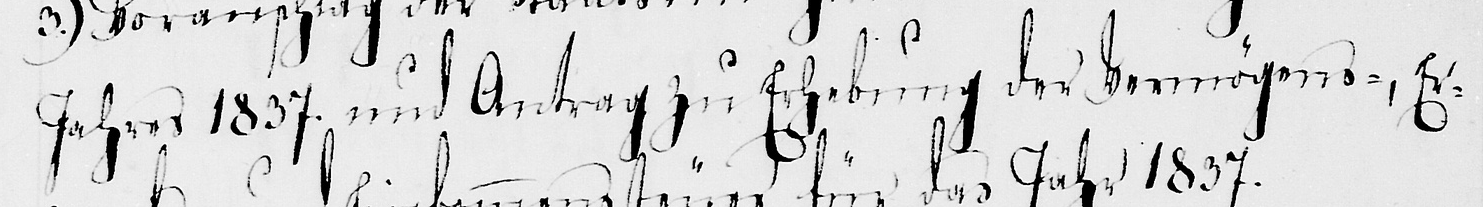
Jahres 1837. und Antrag zu Erhebung der Vermögens-, Er¬
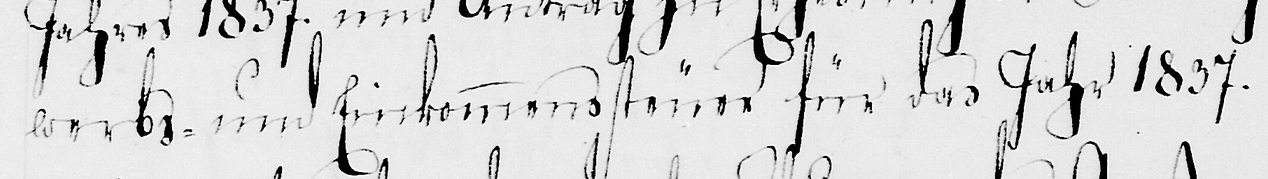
werbs- und Einkommenssteuer für das Jahr 1837.
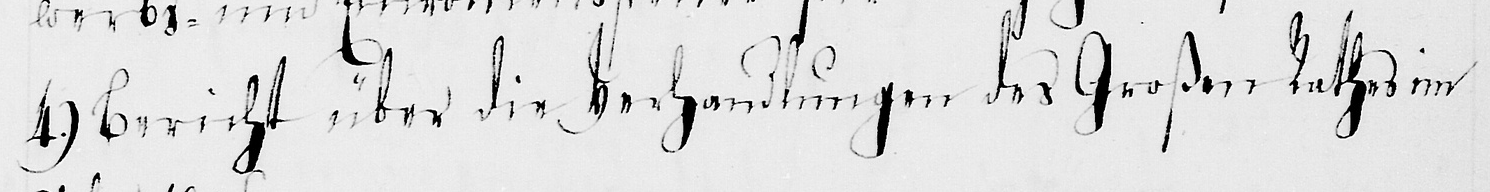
4.) Bericht über die Verhandlungen des Großen Rathes im
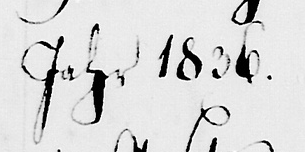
Jahr 1836.
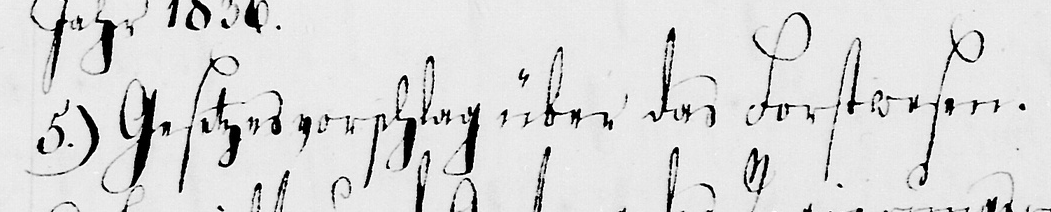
5.) Gesetzesvorschlag über das Forstwesen.
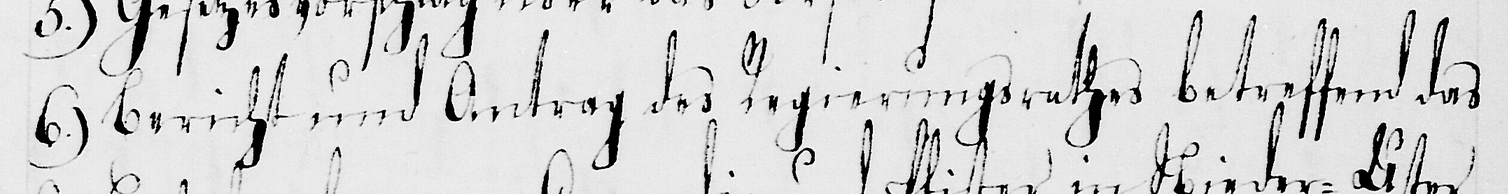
6.) Bericht und Antrag des Regierungsrathes betreffend das
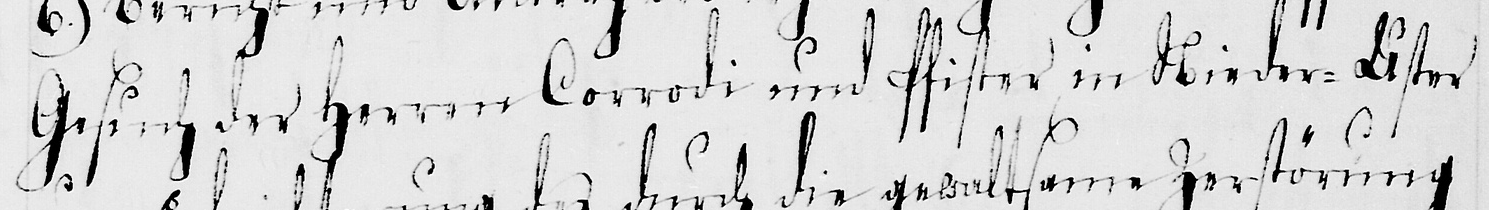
Gesuch der Herren Corrodi und Pfister in Nieder-Uster
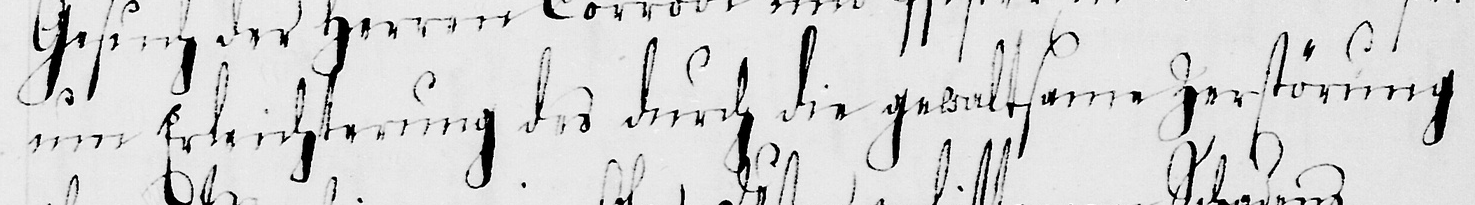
um Erleichterung des durch die gewaltsame Zerstörung
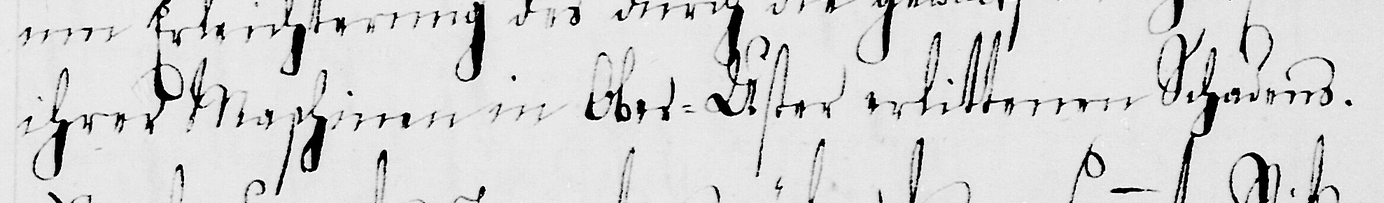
ihrer Maschinen in Ober-Uster erlittenen Schadens.
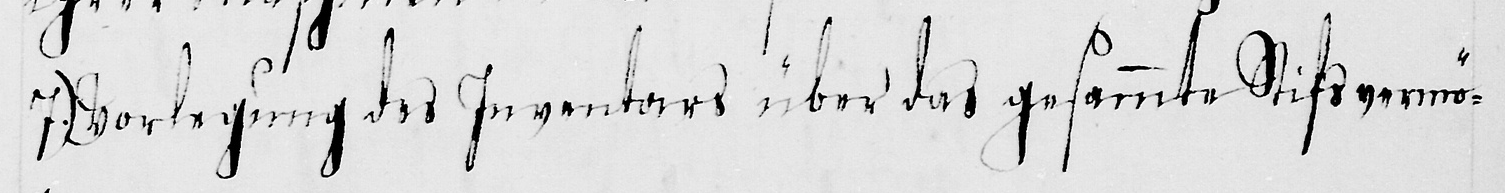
Vorlesung des Inventars über das gesammte Stif[t]svermö¬
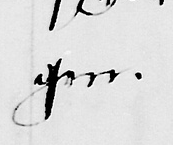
gen.
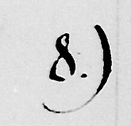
7.)
